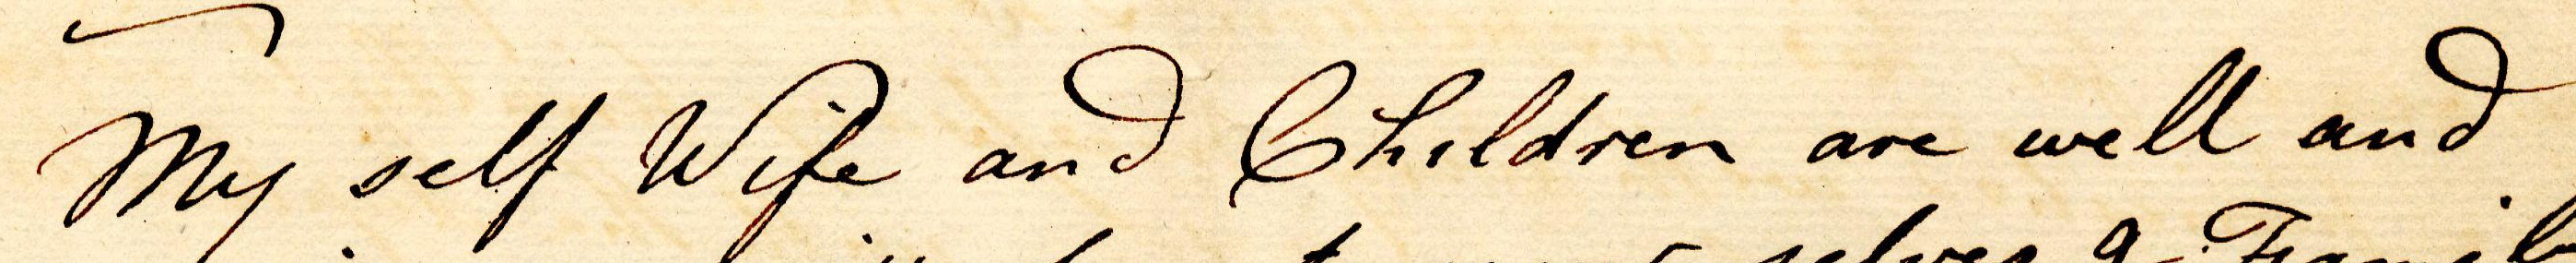My self Wife and Children are well and
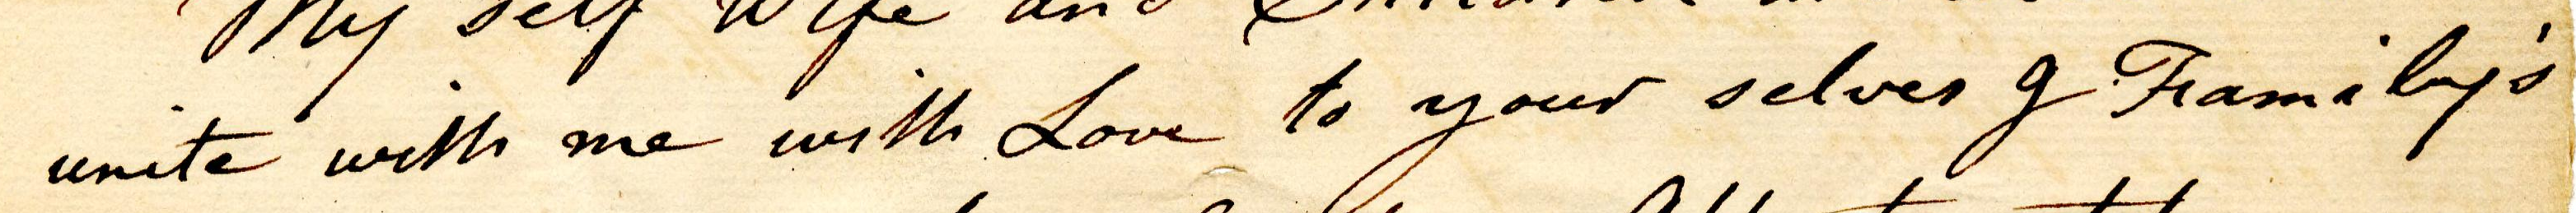unite with me with Love to your selves & Family's
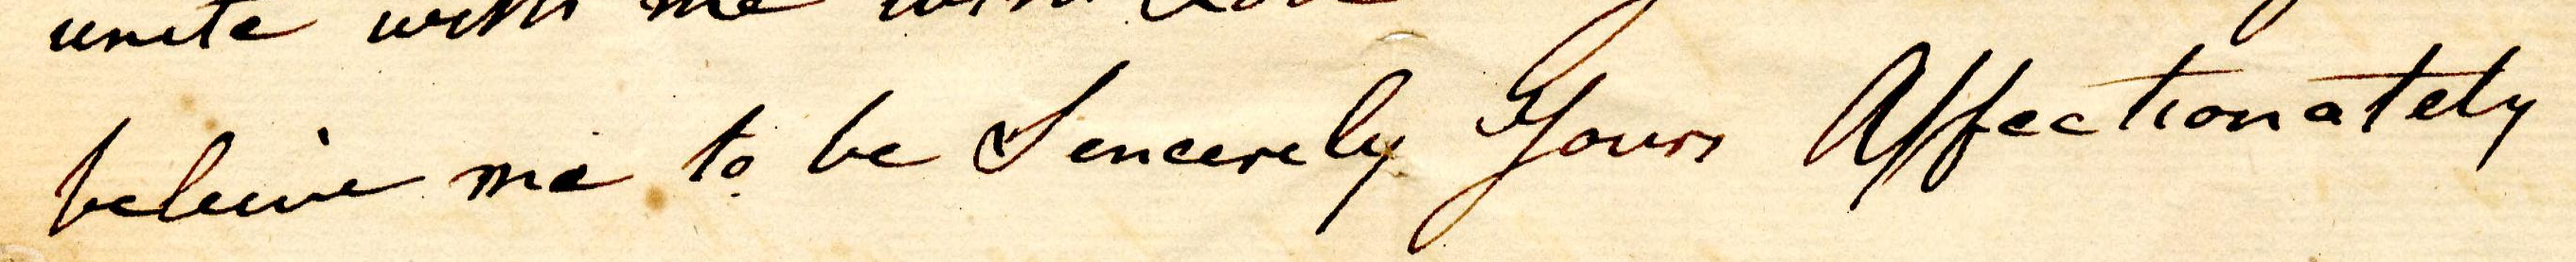believe me to be Sincerely Yours Affectionately
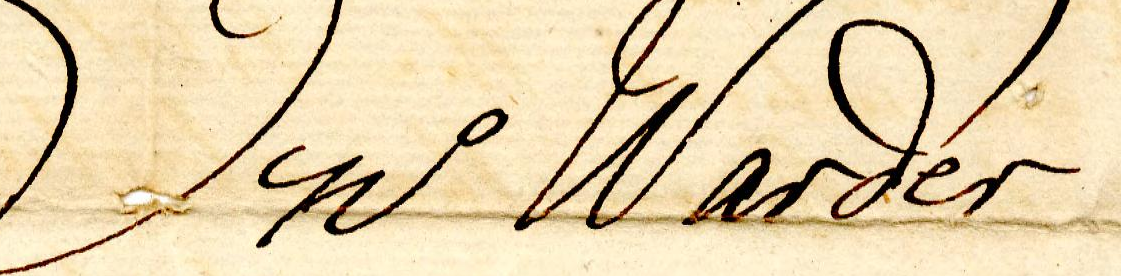Jn^o Warder
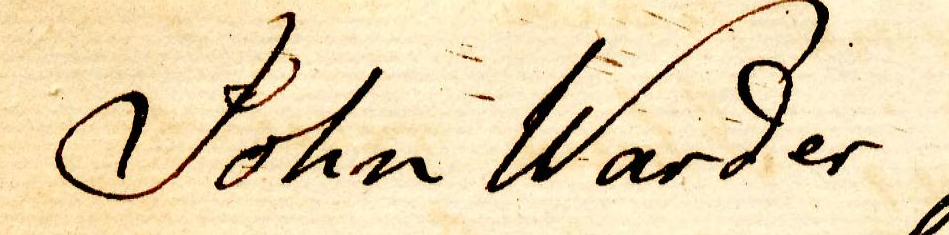John Warder
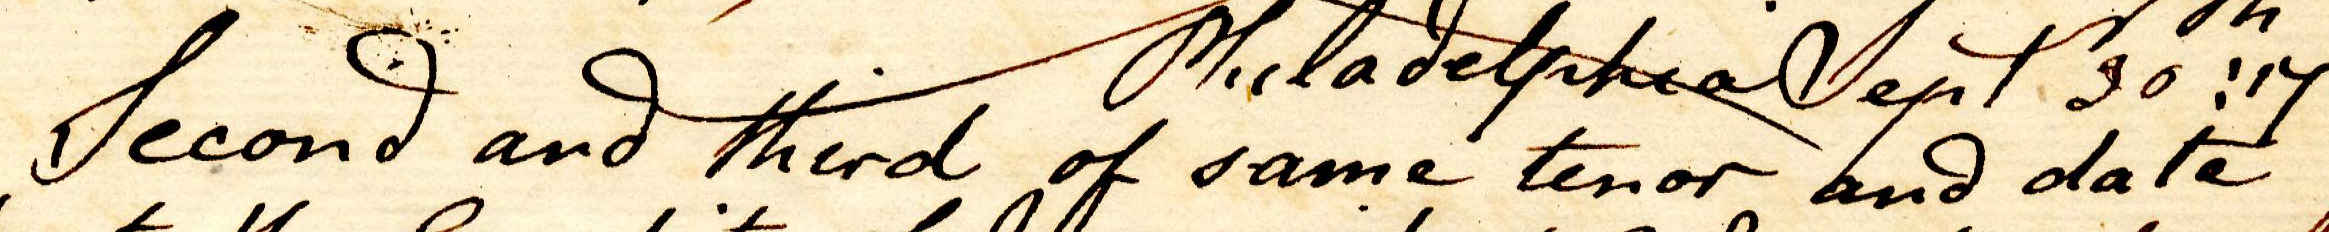Second and third of same tenor and date
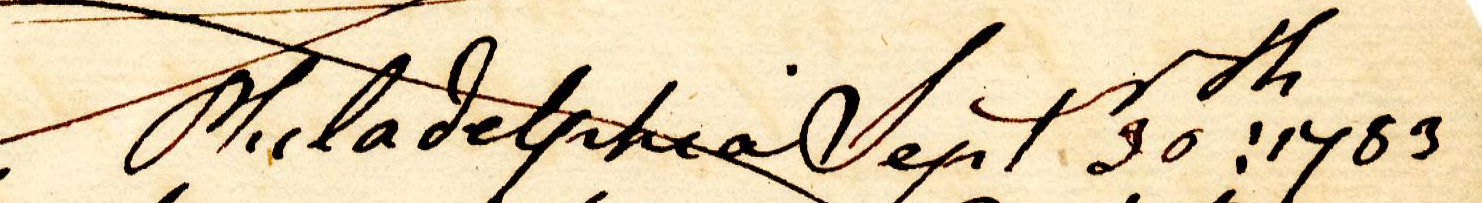Philadelphia Sept 30^th: 1783
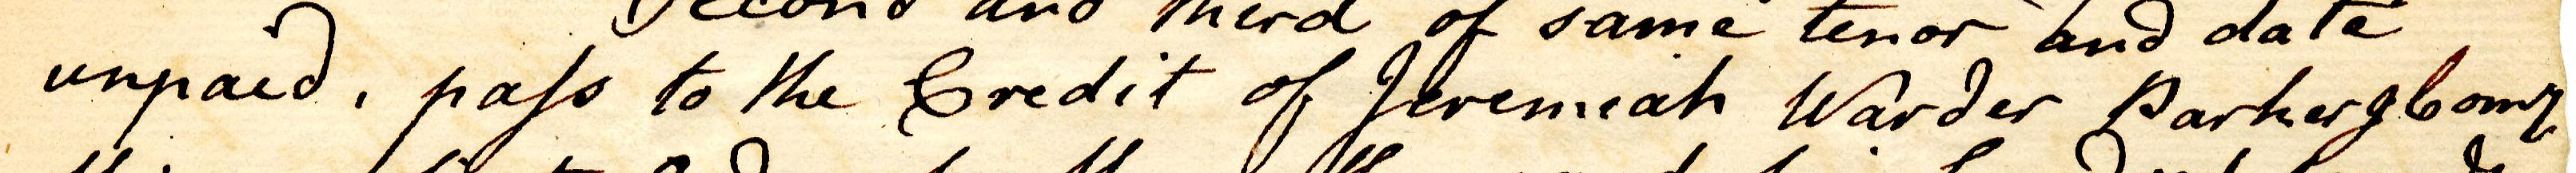unpaid, pass to the Credit of Jeremiah Warder Parker Com^y
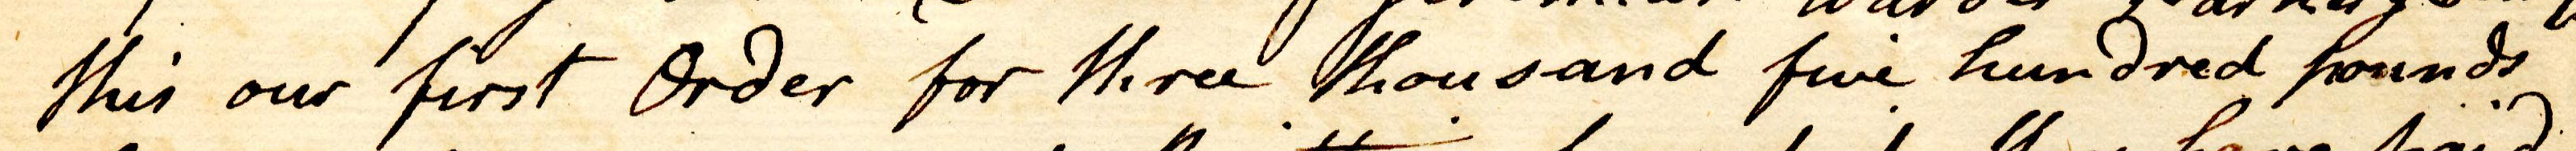this our first Order for three thousand five hundred pounds
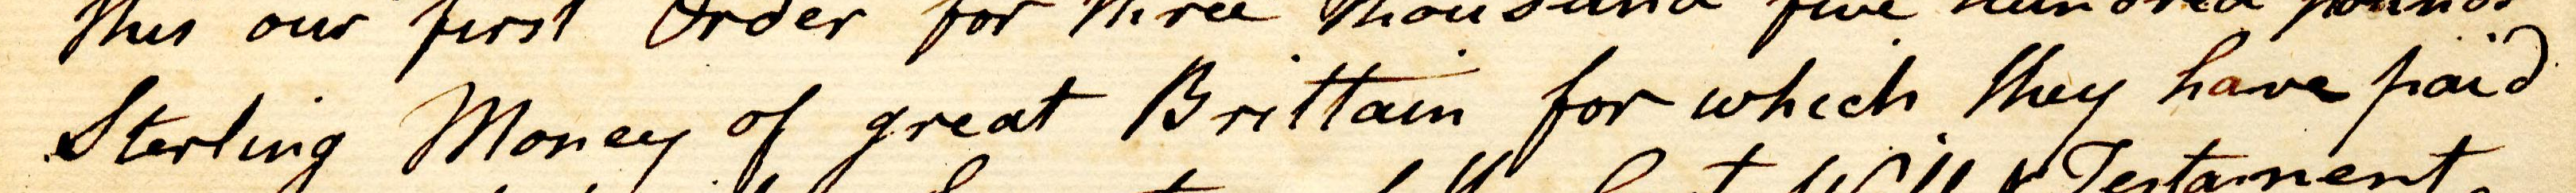Sterling Money of great Brittain for which they have paid
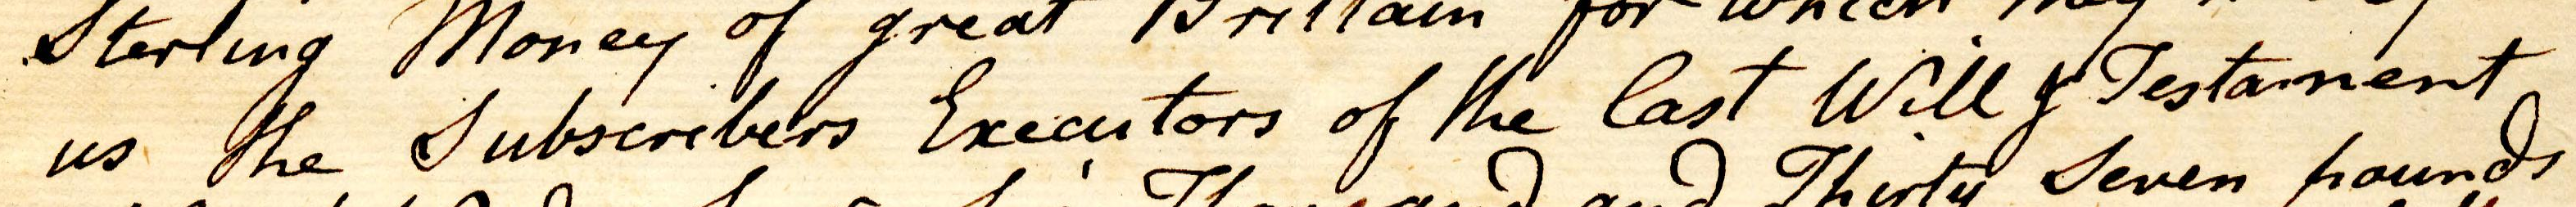us the Subseribers Executors of the last will & Testament
